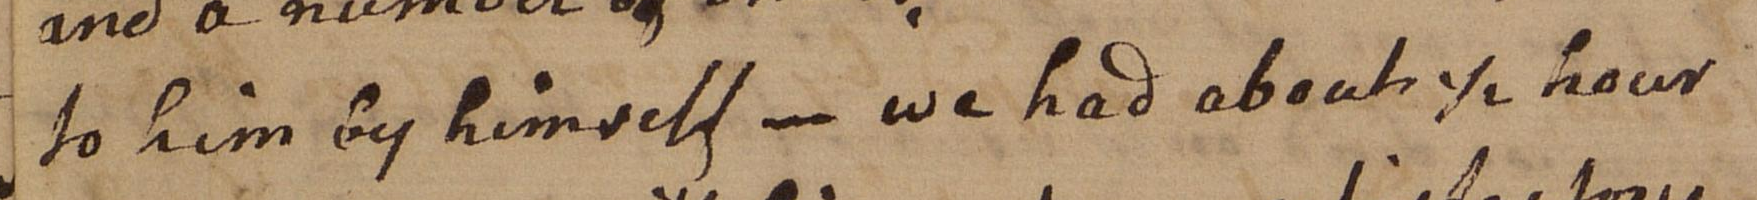to him by himself- we had abouts 1/2 hour
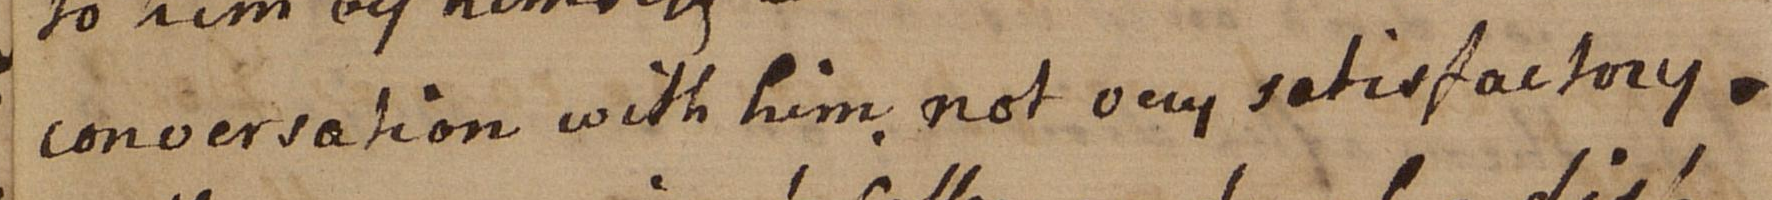conversation with him not very satisfactory.
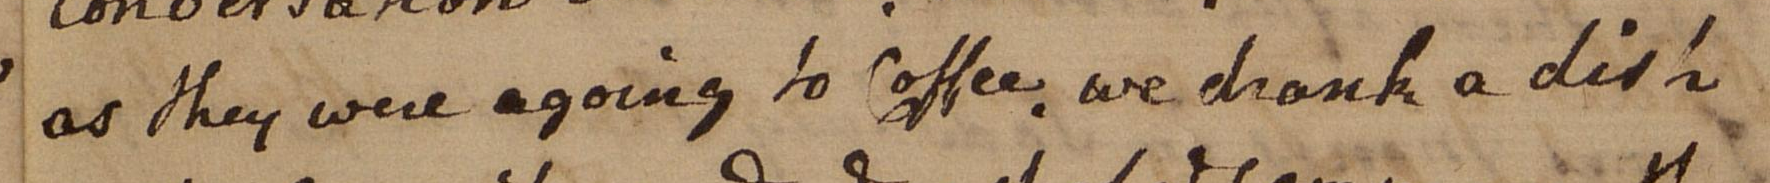as they were agoing to Coffee. we drank a dish
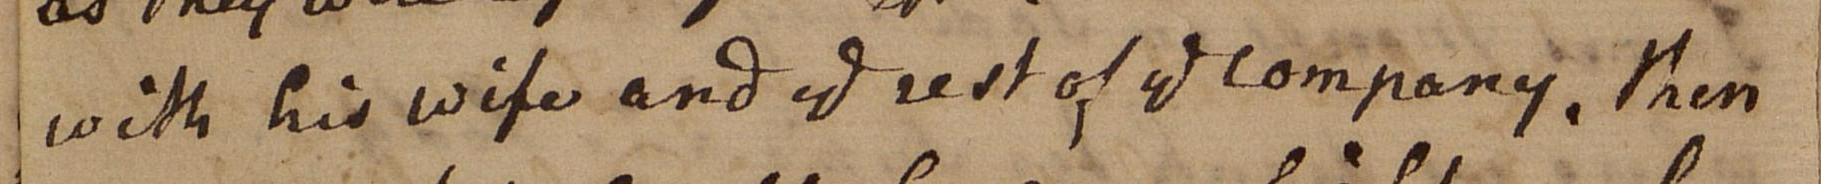with his wife and y^e rest of y^e company, then
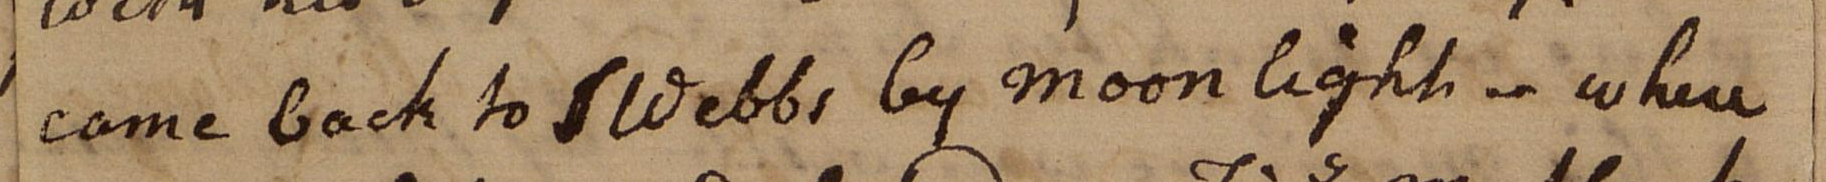came back to S Webbs by moon light- where
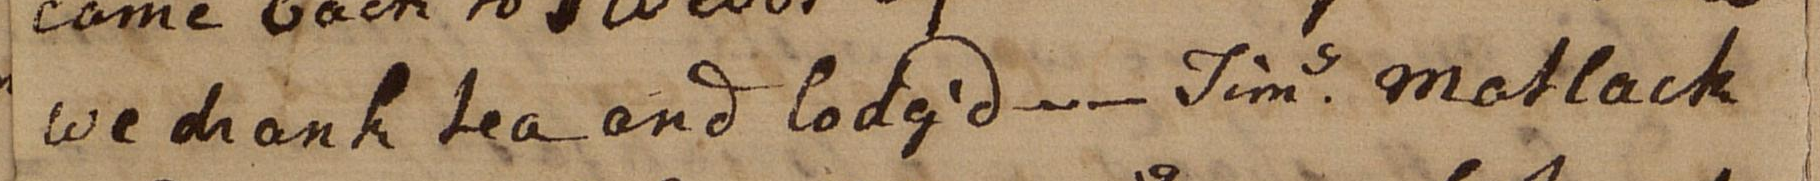we drank tea and lodg'd-- Tim^y. Matlack
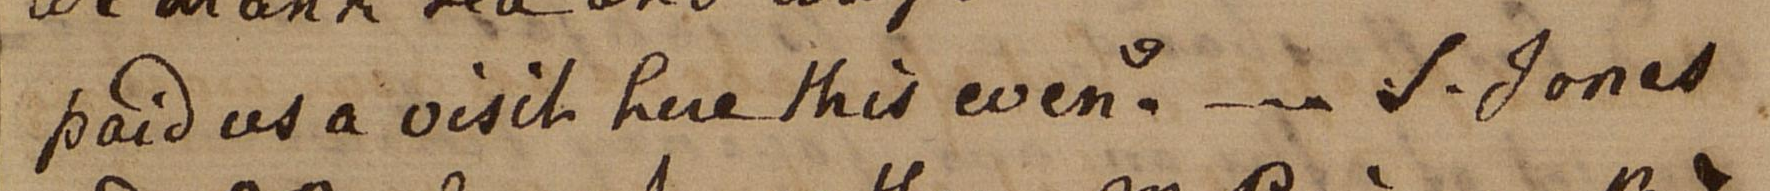paid us a visit here this even^g.- S. Jones
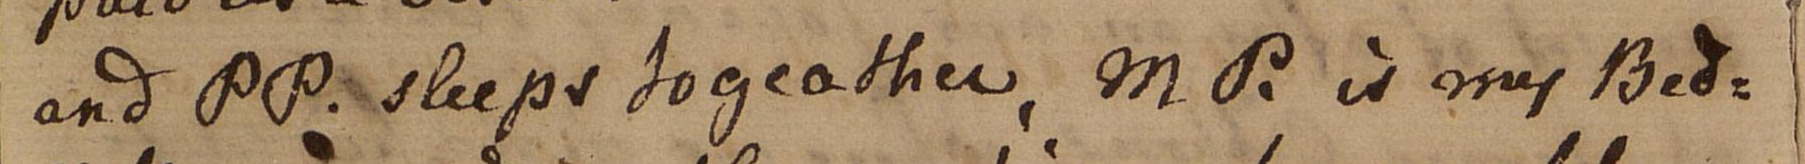and PP. sleeps togeather, M P. is my Bed-
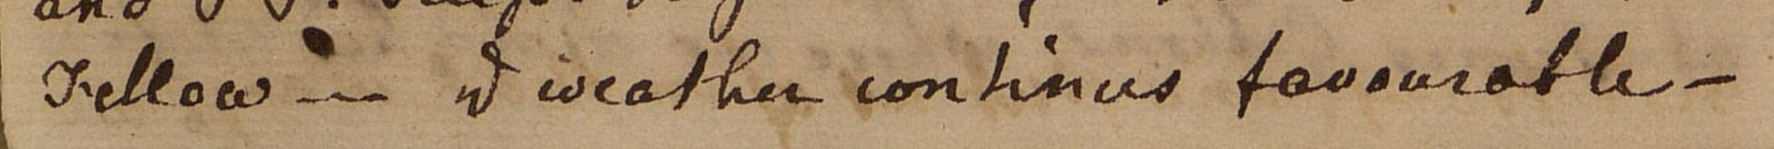Fellow- y^e weather continus favourable-
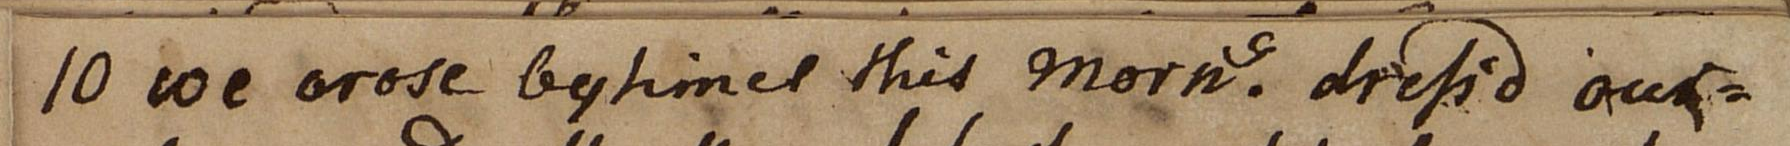10 we arose by times this morn^g. dress'd out-
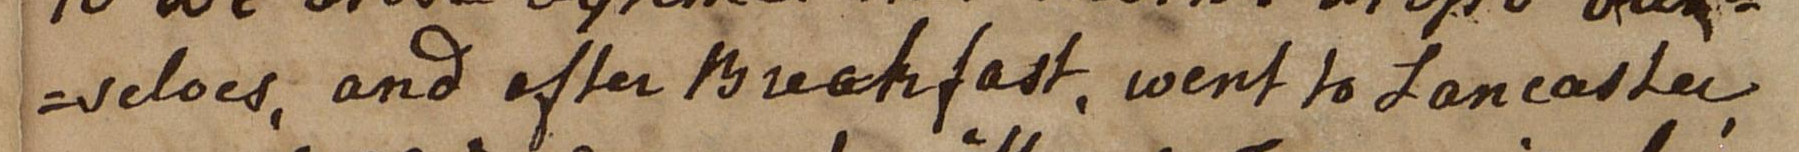-selves, and after Breakfast, went to Lancaster,
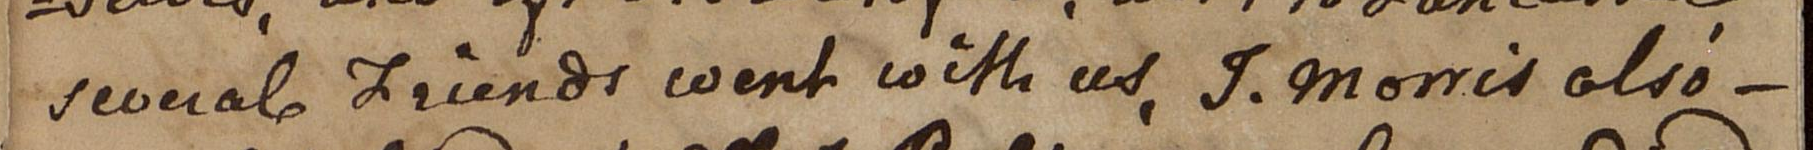several Friends went with us, I. Morris also-
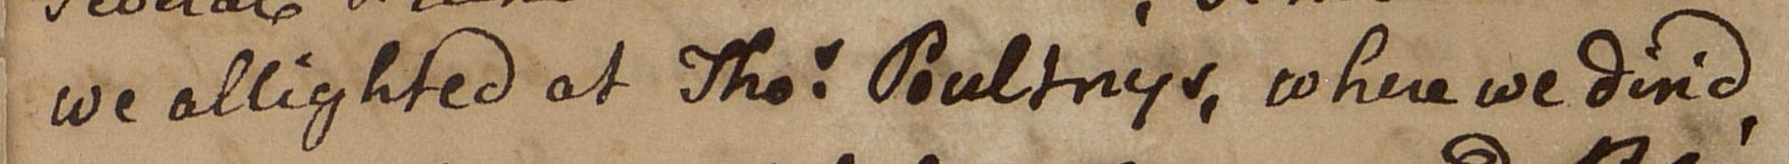we allighted at Tho^s. Poultnys, where we din'd,
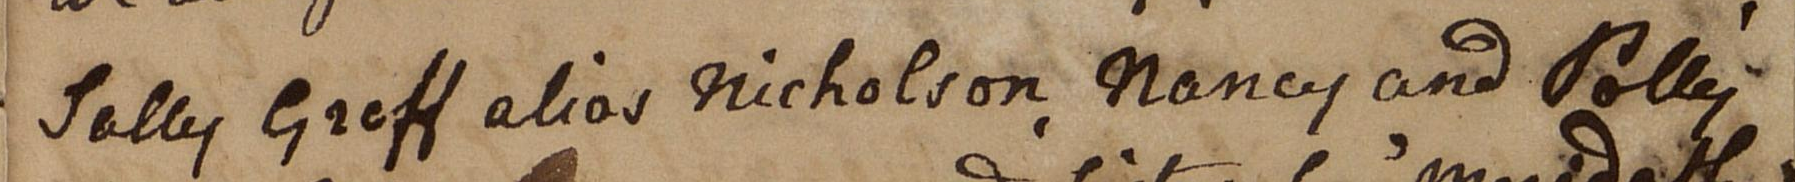Sally Groff alias Nicholson, Nancy and Polly
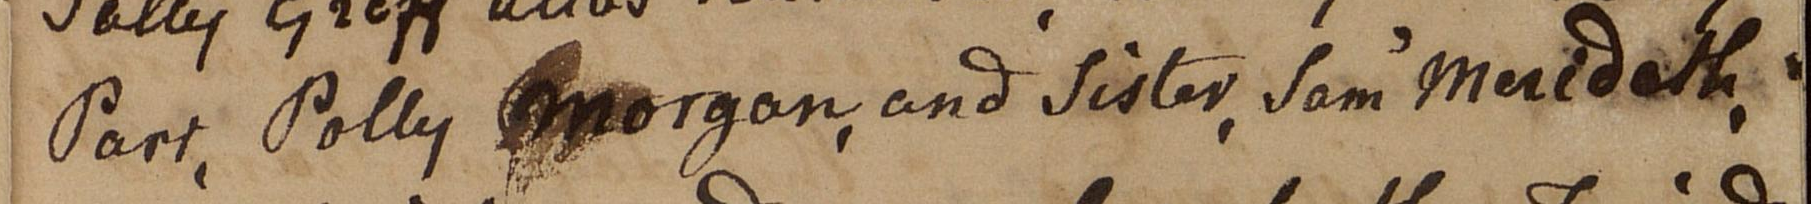Part, Polly Morgan, and Sister, Sam^l Merideth,
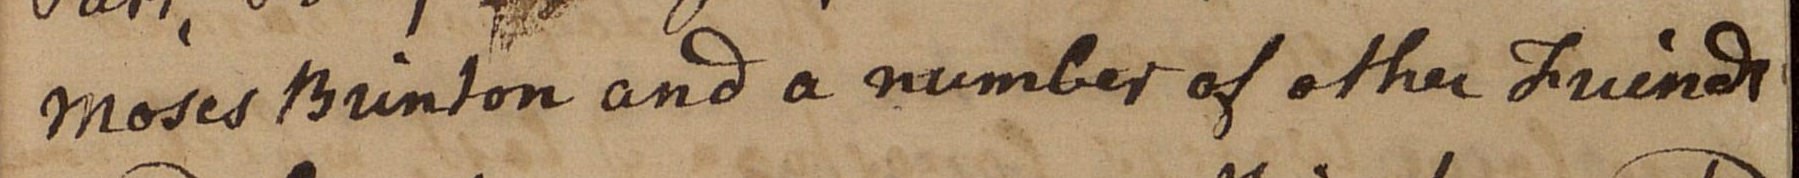Moses Brinton and a number of other Friends
